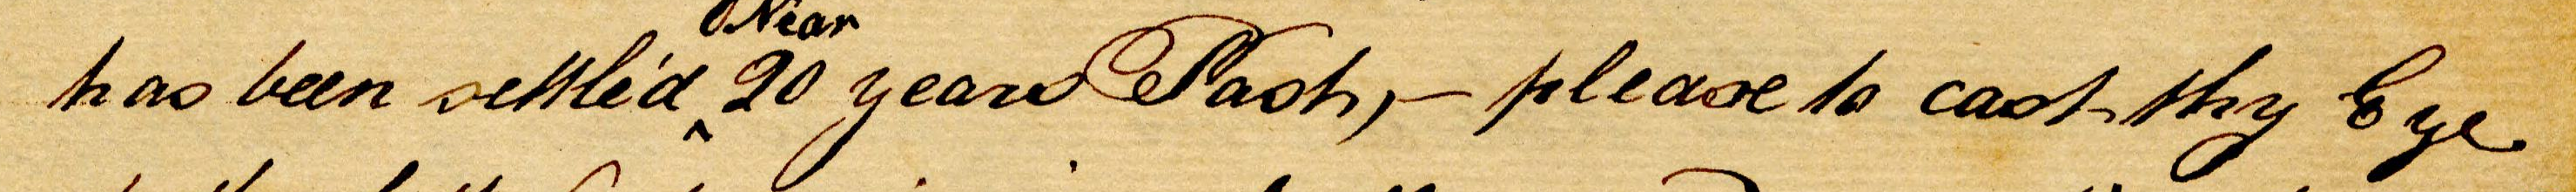has been settle'd ^ 20 years Past, - please to cast thy Eye
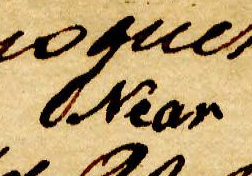Near
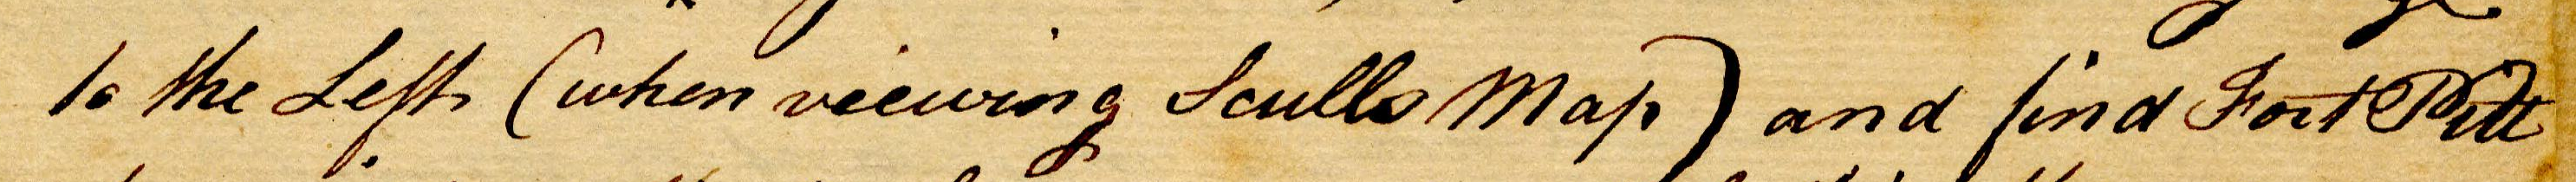to the Left (when viewing Sculls Map) and find Fort Pitt
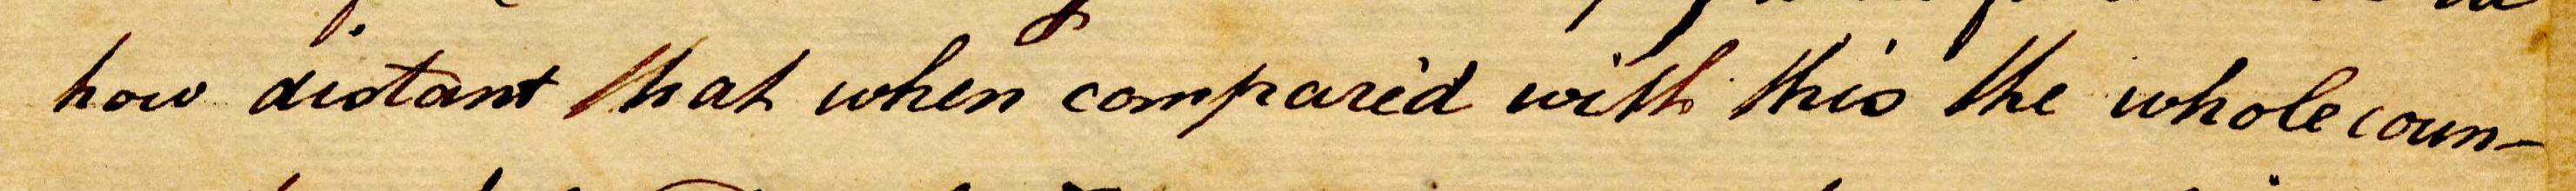how distant that when compare'd with this the whole coun-
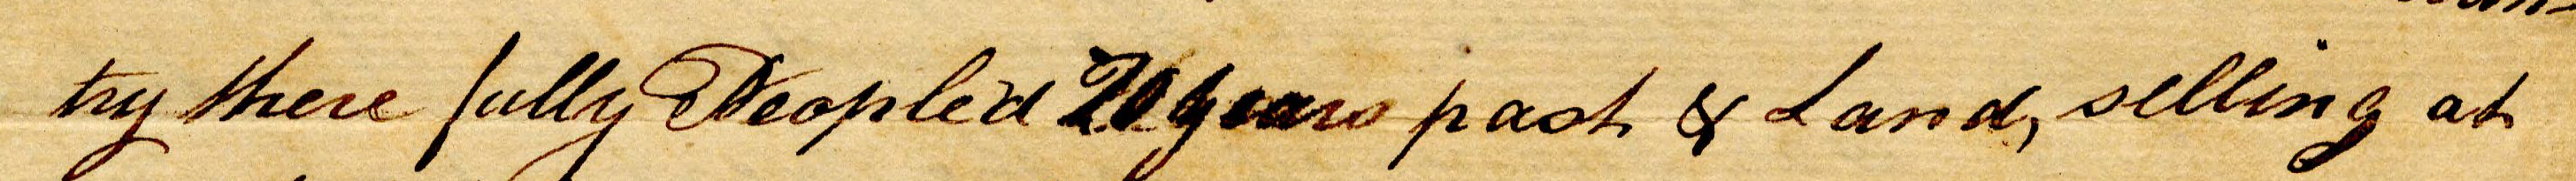try there fully Peopled 20 years past & Land, selling at
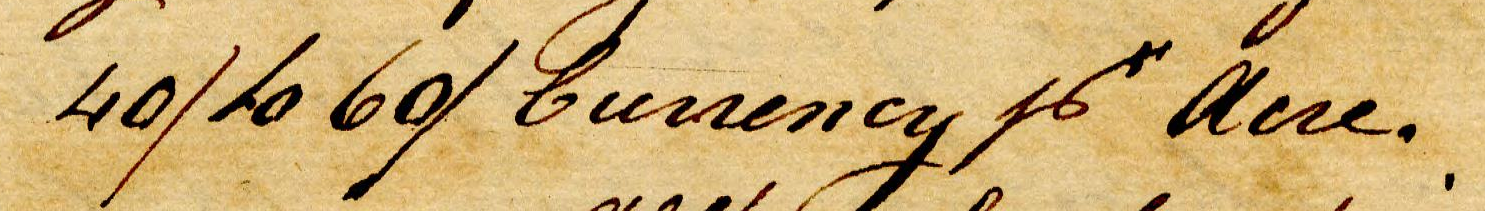40s to 60s Currency p^r Acre.
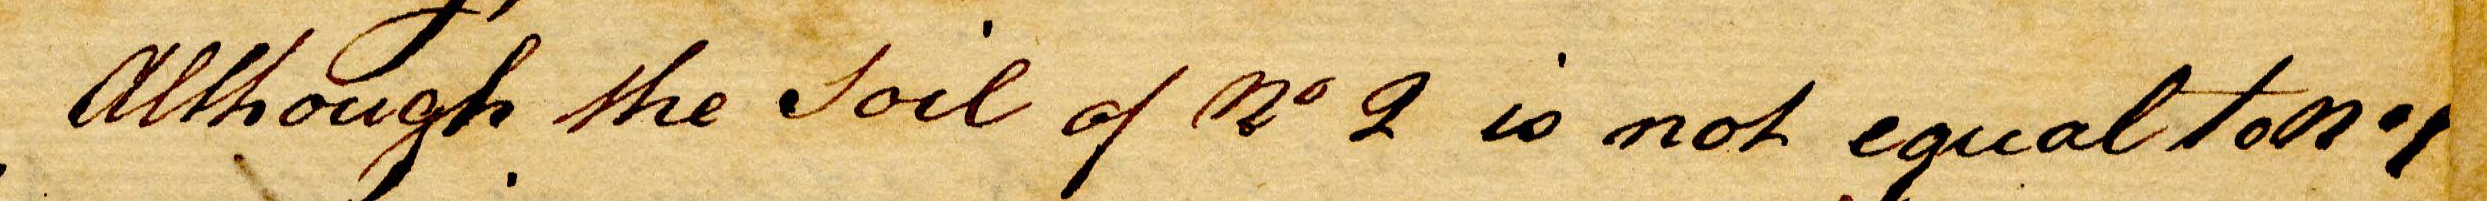Although the Soil of N^o 2 is not equal to N^o 1
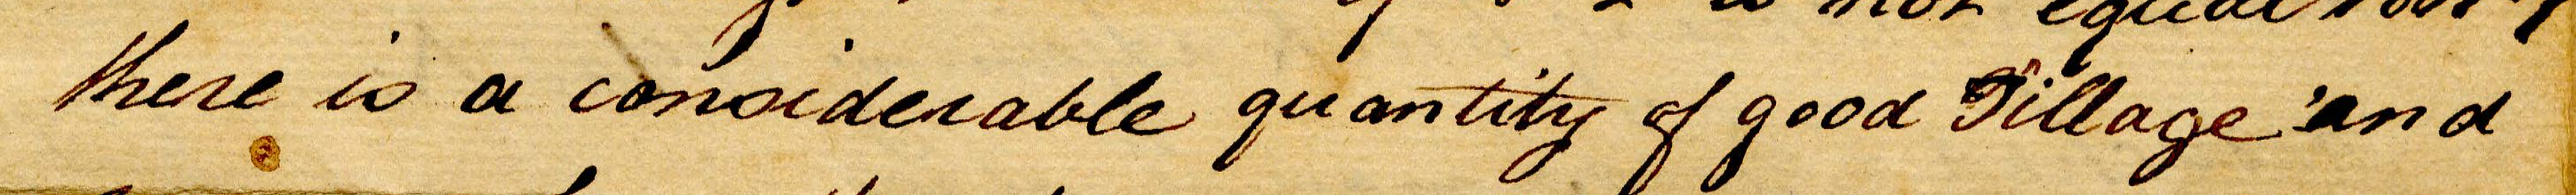there is a considerable quantity of good Tillage and
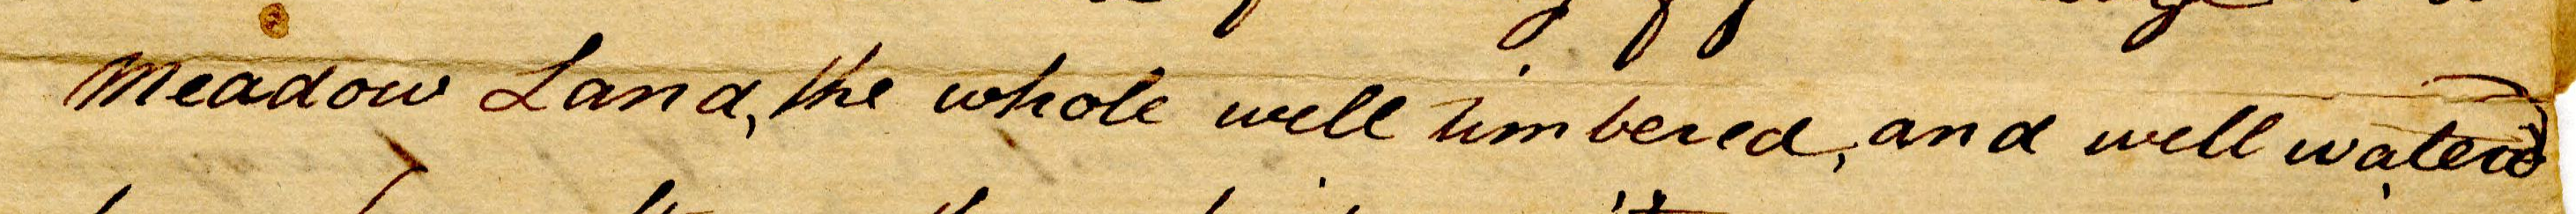Meadow Land, the whole well timbered, and well watered
